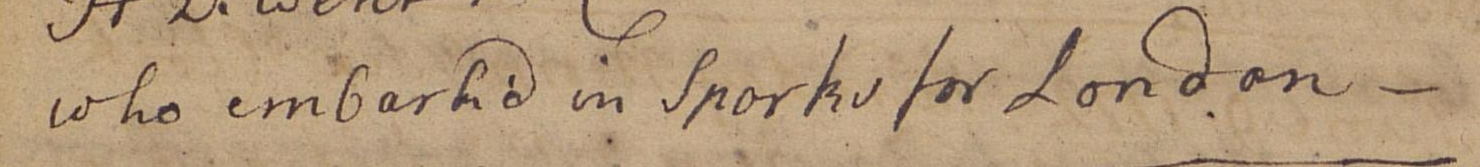who embark'd in Sporks for London-
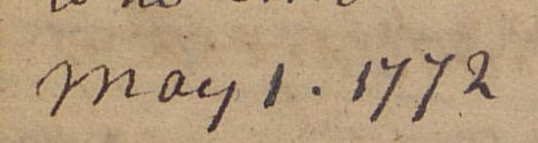May 1. 1772
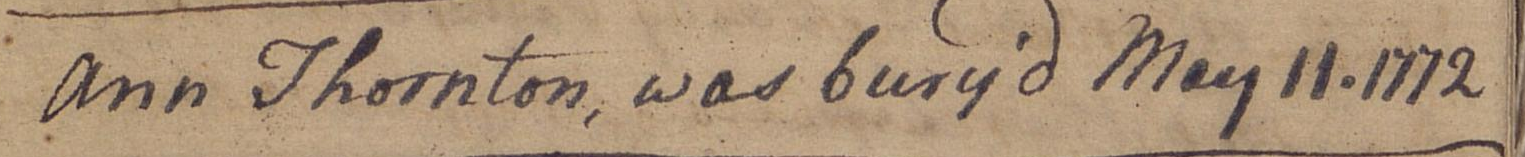Ann Thornton was bury'd May 11. 1772
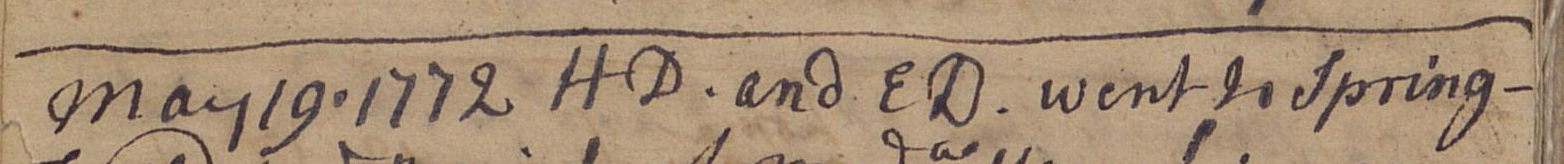May 19. 1772 HD and ED. went to Spring-
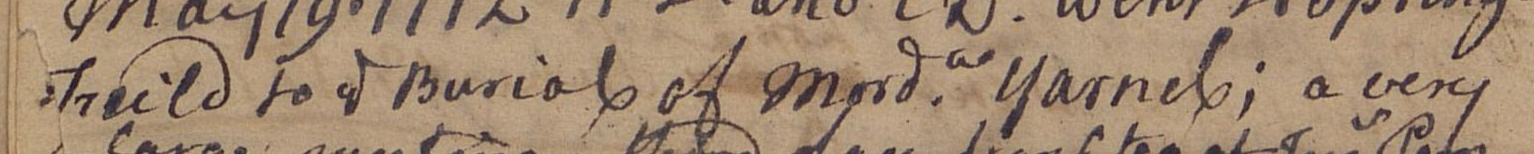haild to y^e Burial of Mord^a Yarnel; a very
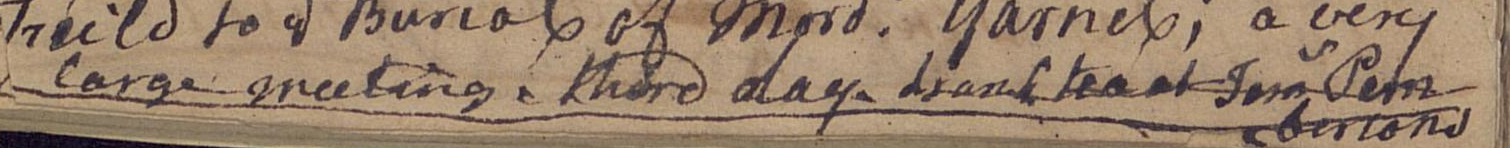large meeting third day. drank tea at Tom^s Pem-
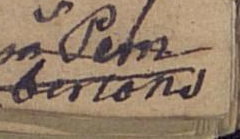bertons
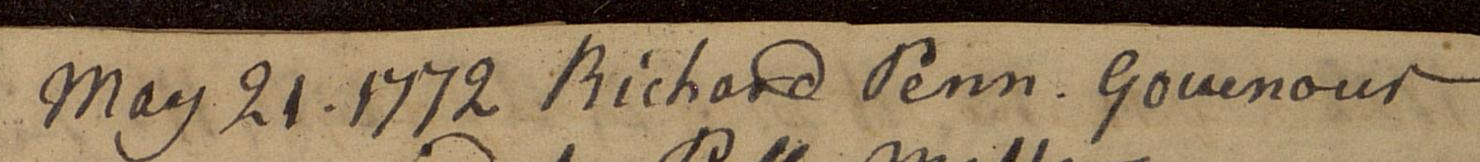May 21 1772 Richard Penn. Govenour
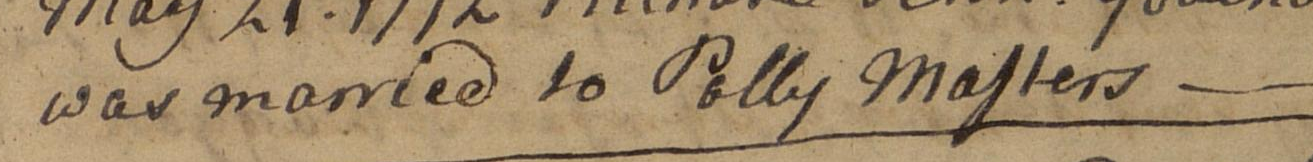was married to Polly Masters-
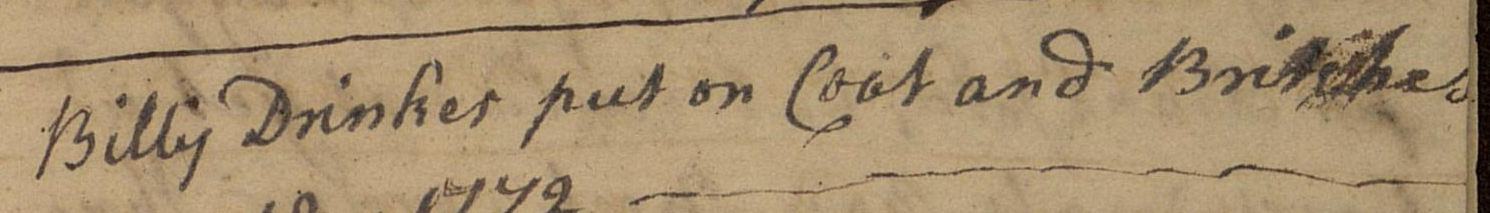Billy Drinker put on Coat and Britches
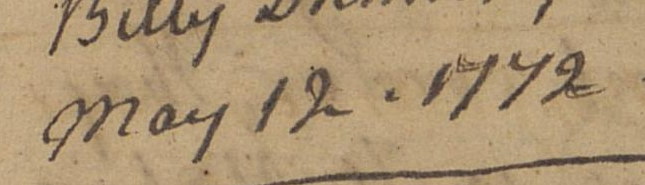May 12 1772 -
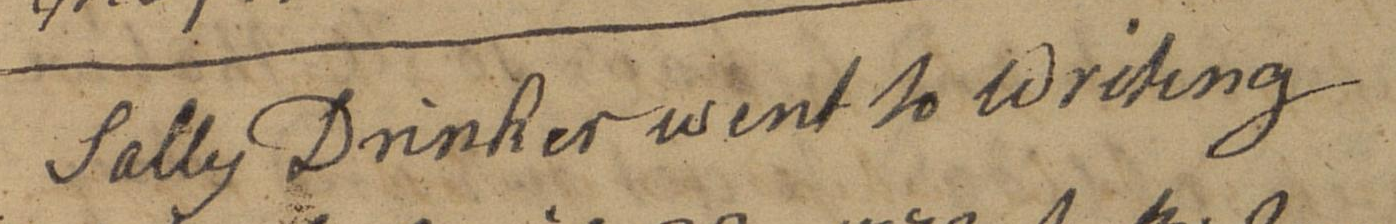Sally Drinker went to Writing
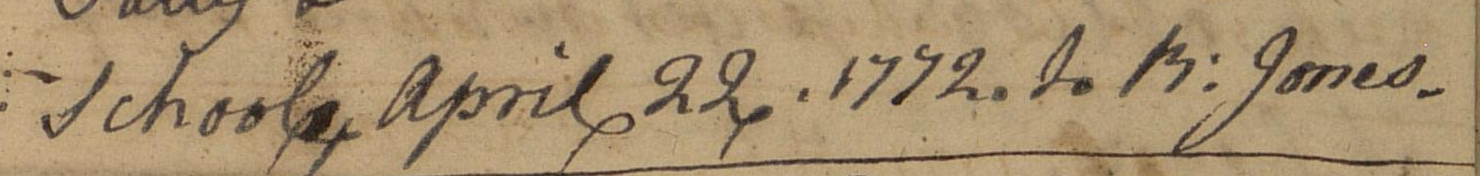School April 22. 1772. to R: Jones.
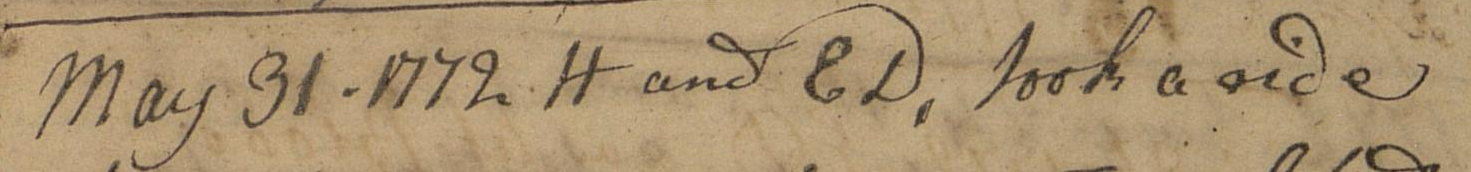May 31. 1772 H and ED, took a ride
